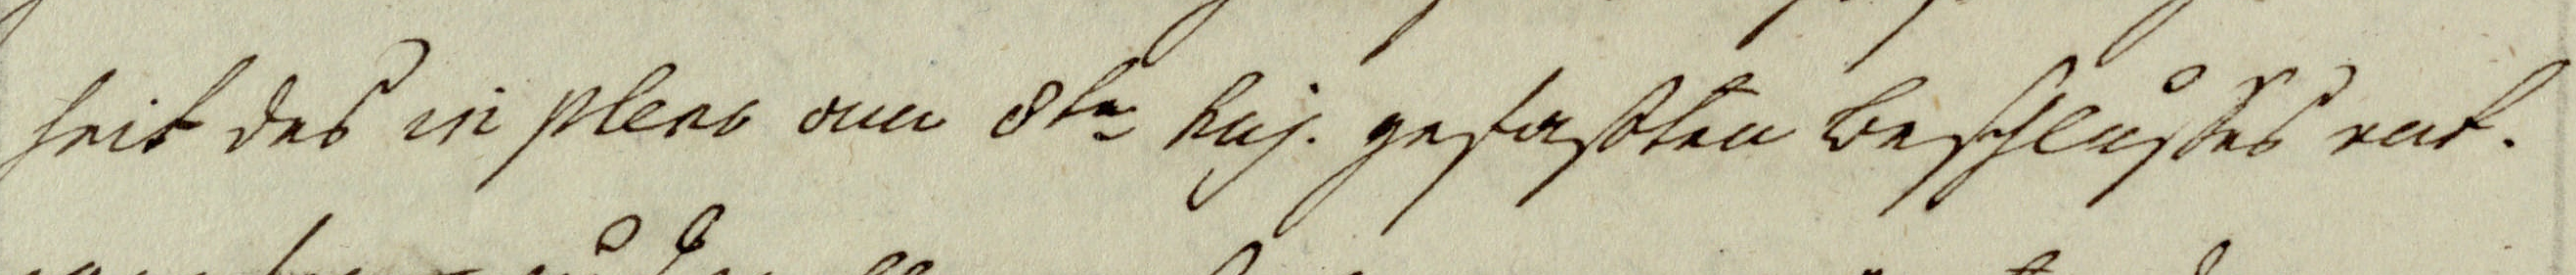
heit des in pleno am 8 te huj. gefaßten Beschlusses ent¬
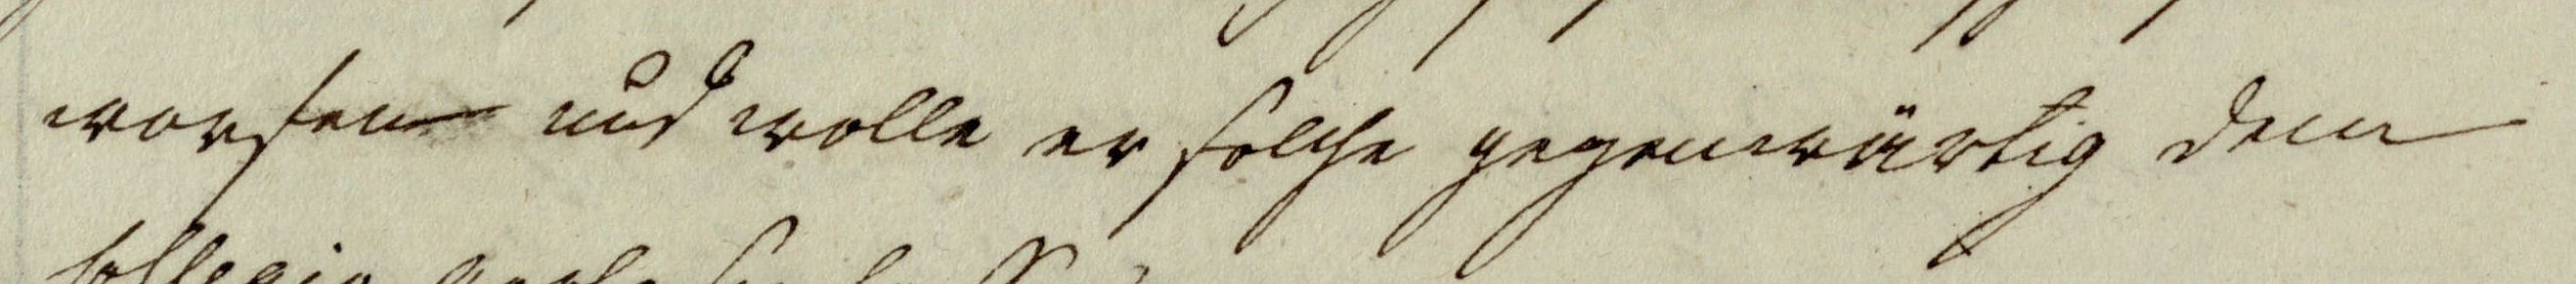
worfen und wolle er solche gegenwärtig dem
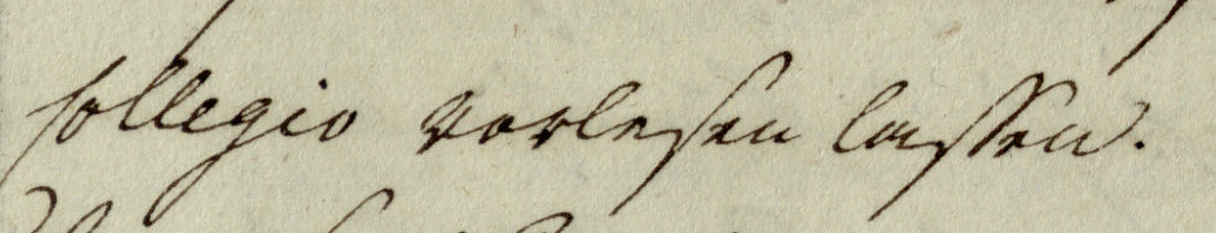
Collegio vorlesen lassen.
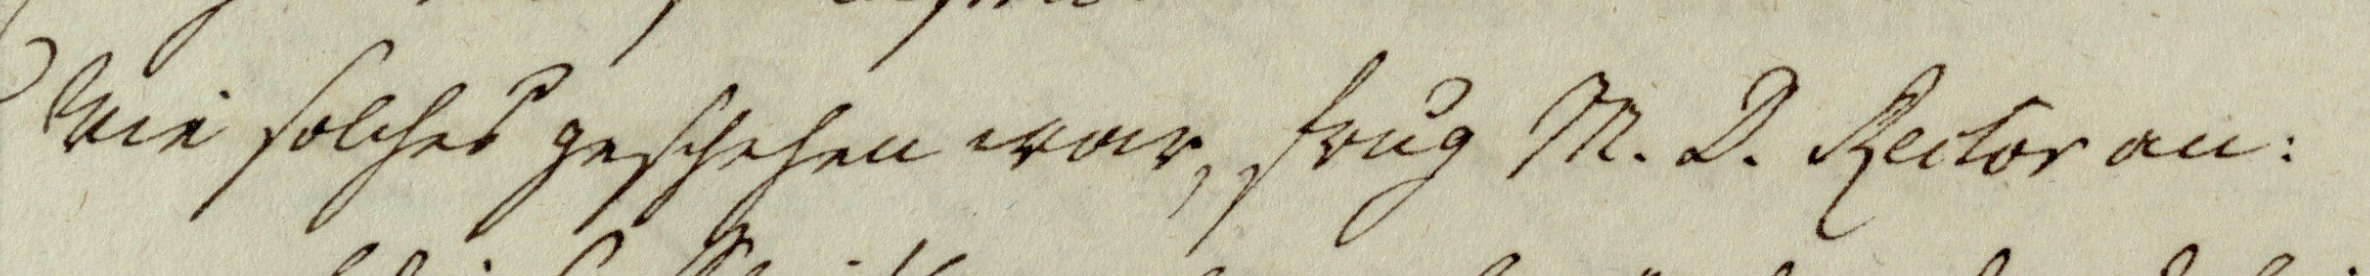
Wie solches geschehen war, frug M. D. Rector an:
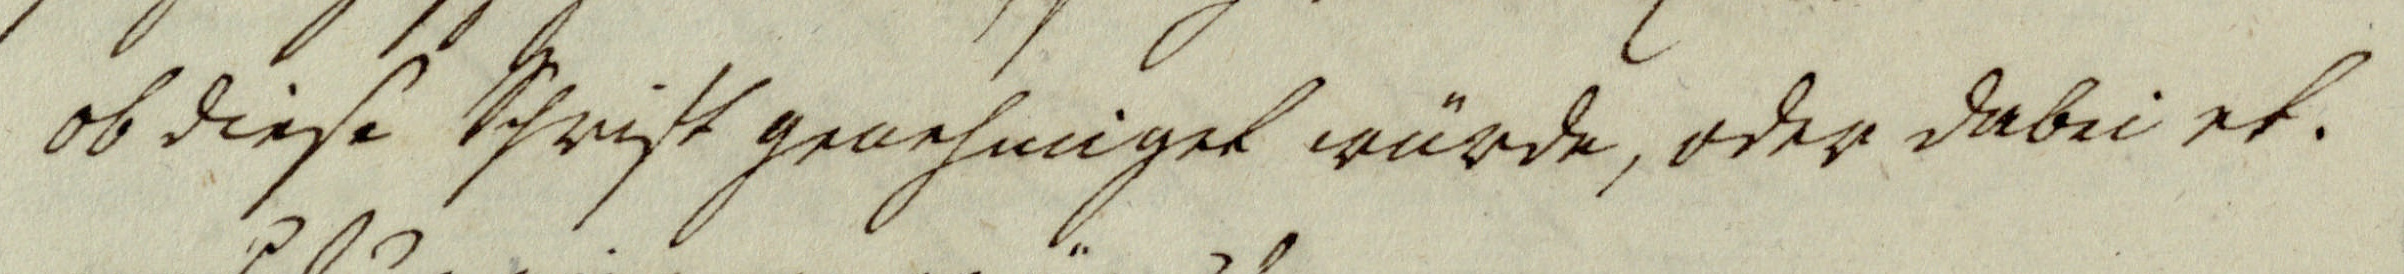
ob diese Schrift genehmiget würde, oder dabei et¬
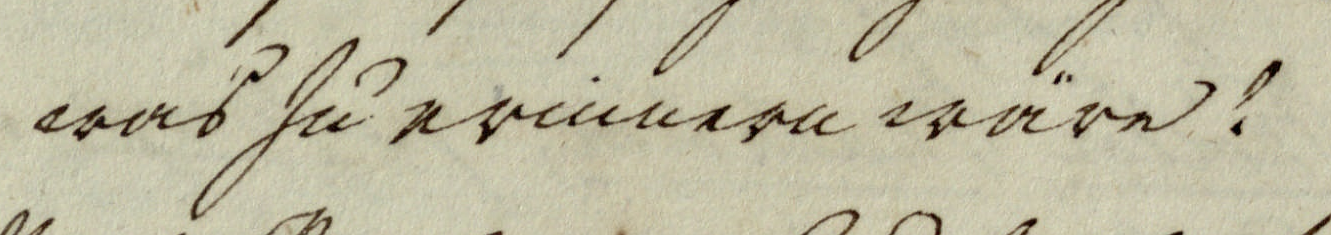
was zu erinnern wäre?
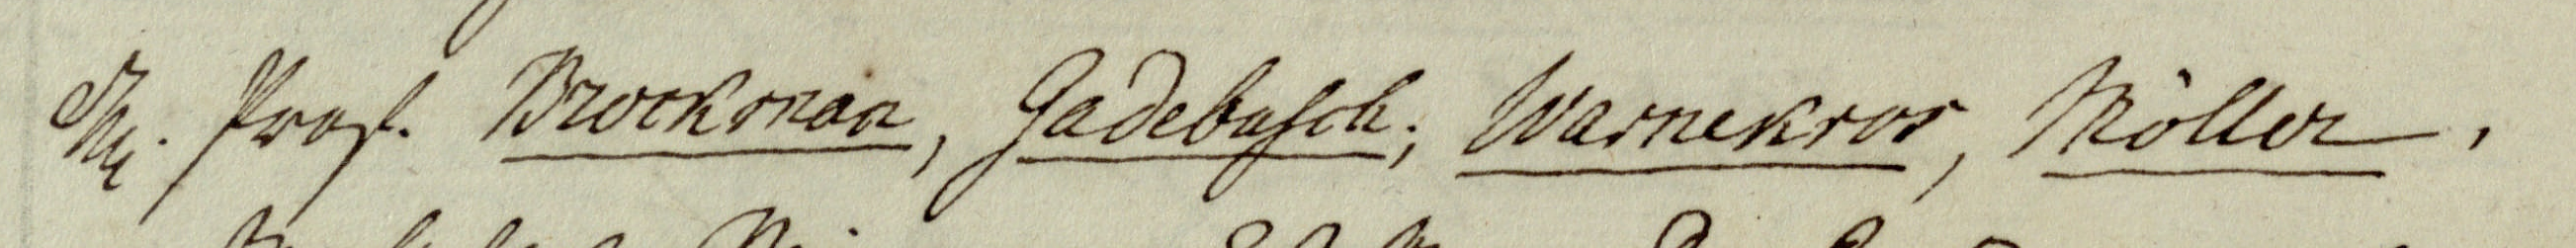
dh. Prof. Brockman, Gadebusch, Warnekros, Möller,
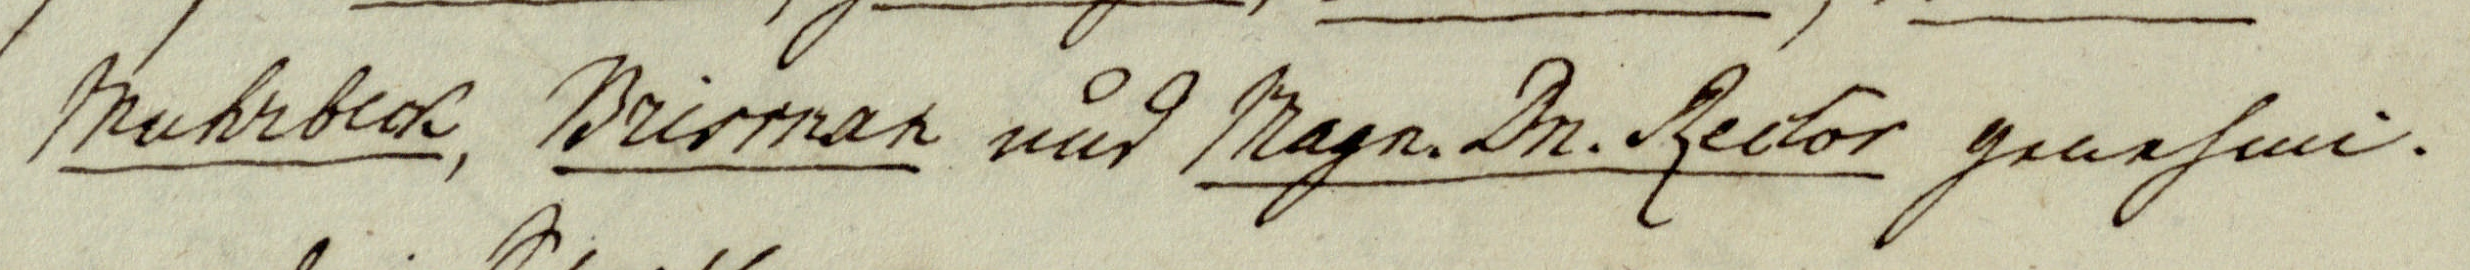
Muhrbeck, Brisman und Magn. Dn. Rector genehmi¬
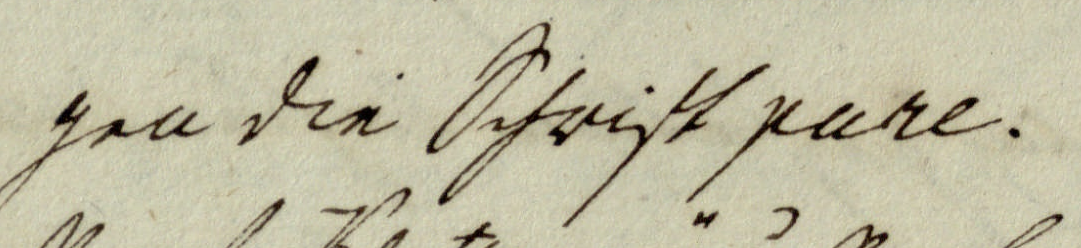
gen die Schrift pure.
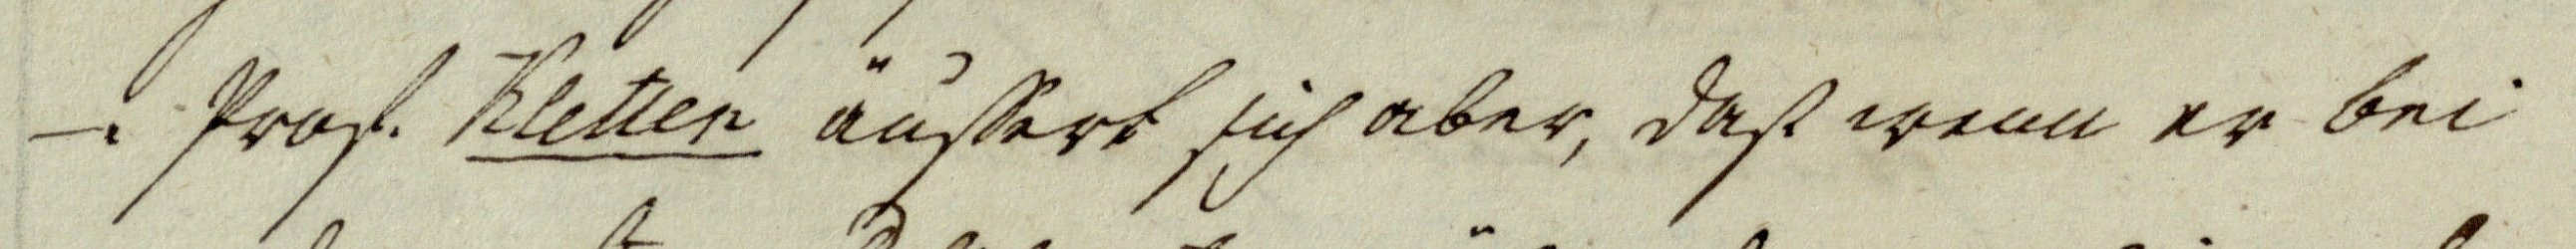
Prof. Kletten äussert sich aber, daß wenn er bei
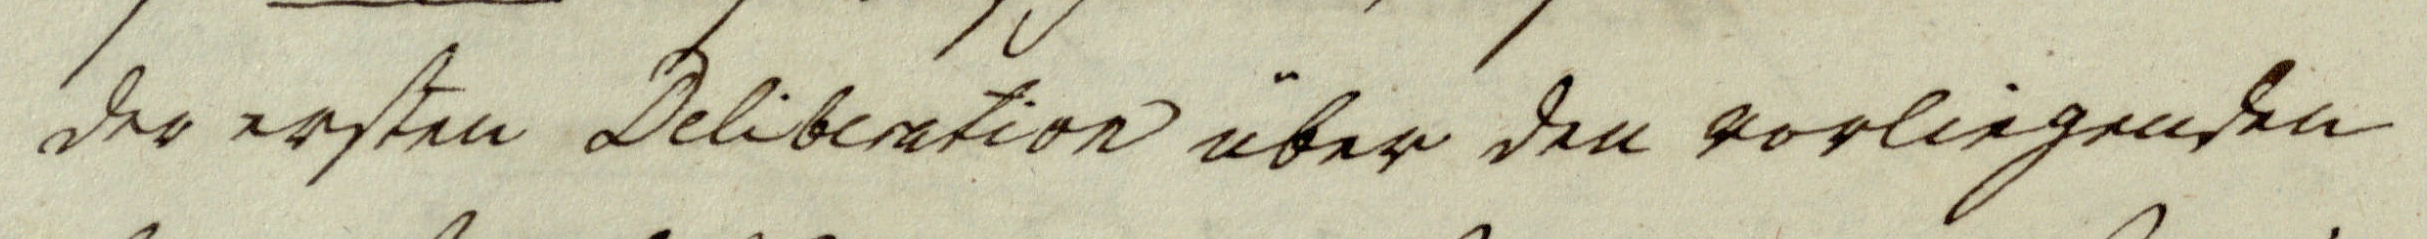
der ersten Deliberation über den vorliegenden
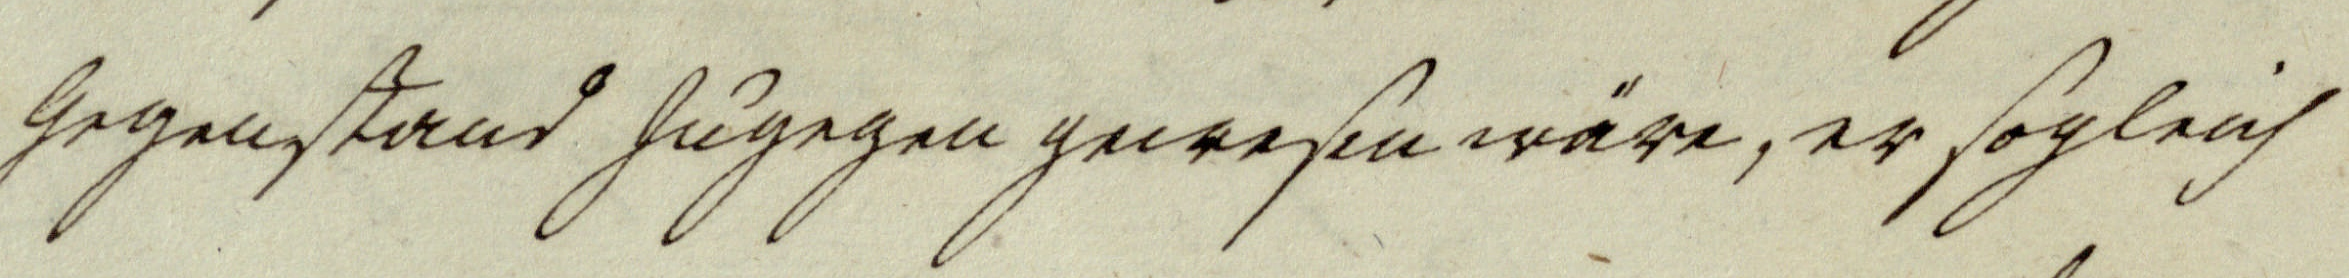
Gegenstand zugegen gewesen wäre, er sogleich
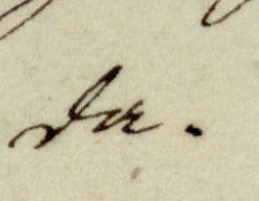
da¬
